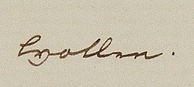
wollen.
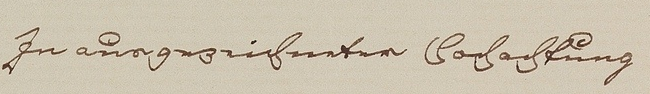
In ausgezeichneter Hochachtung
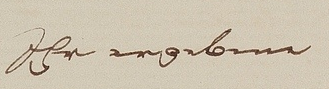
Ihr ergebene
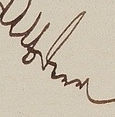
Escher
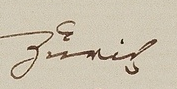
Zürich
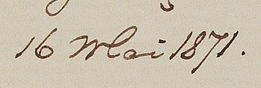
16 Mai 1871.
